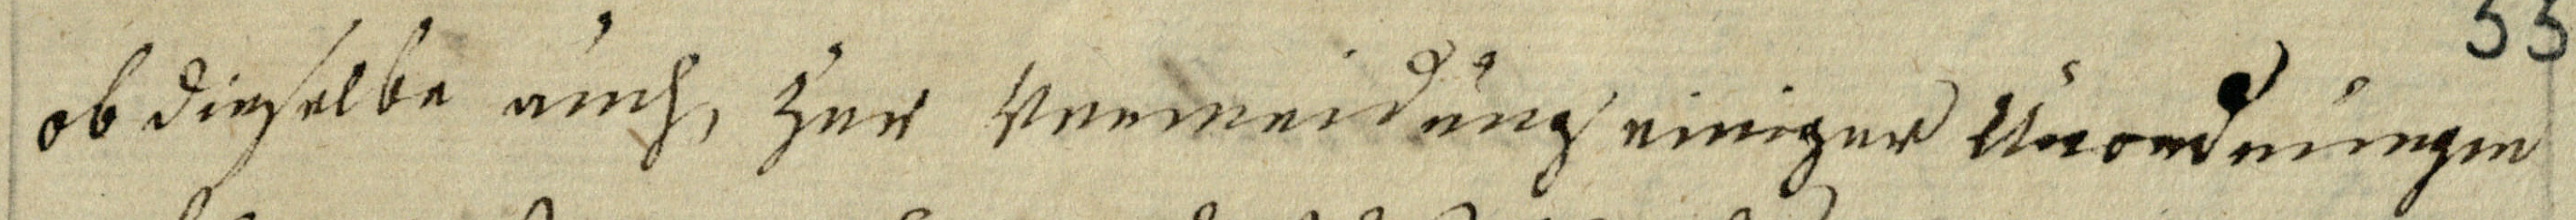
ob dieselbe auch, zur Vermeidung einiger Unordnungen
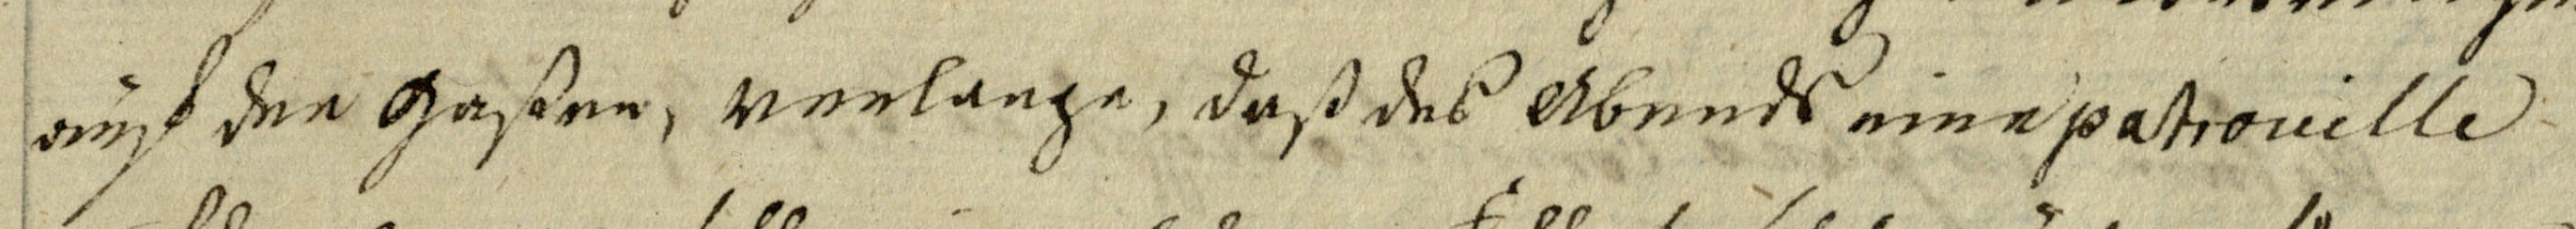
auf den Gaßen, verlange, daß des Abends eine patrouille
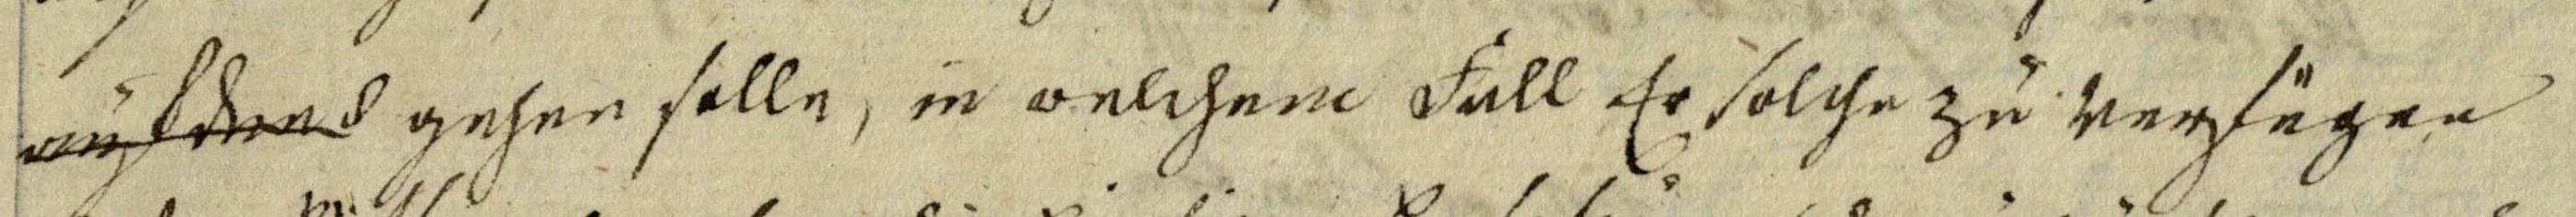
auf dem gehen solle, in welchem Fall Er solche zu verfügen
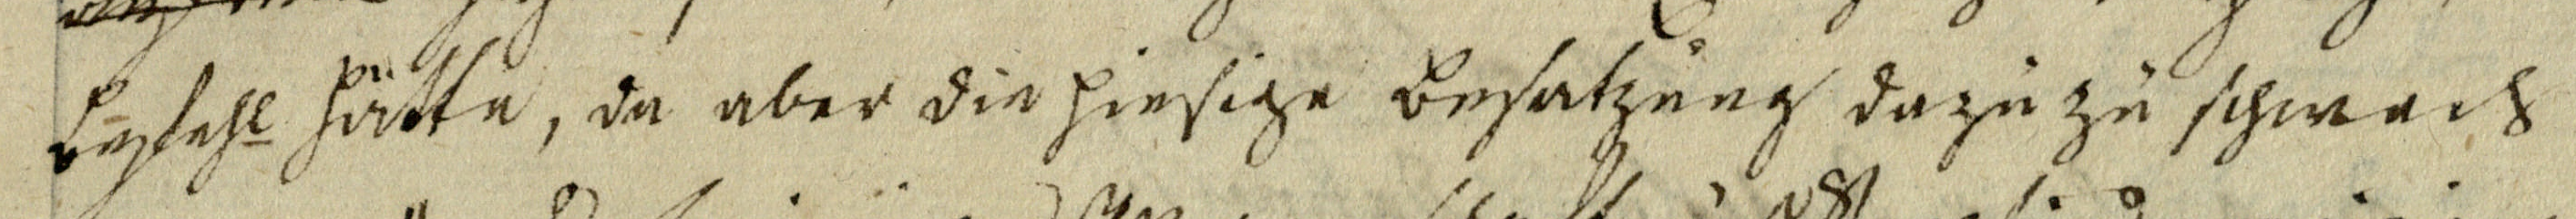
Befehl hätte, da aber die hiesige Besatzung dazu zu schwach
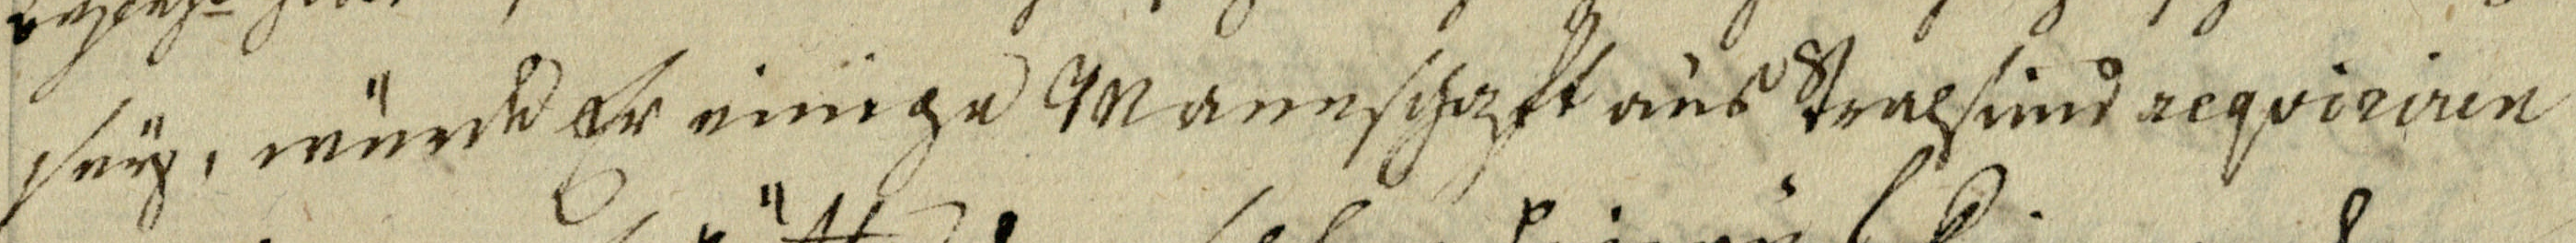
seÿ, würde Er einige Mannschaft aus Stralsund requiriren
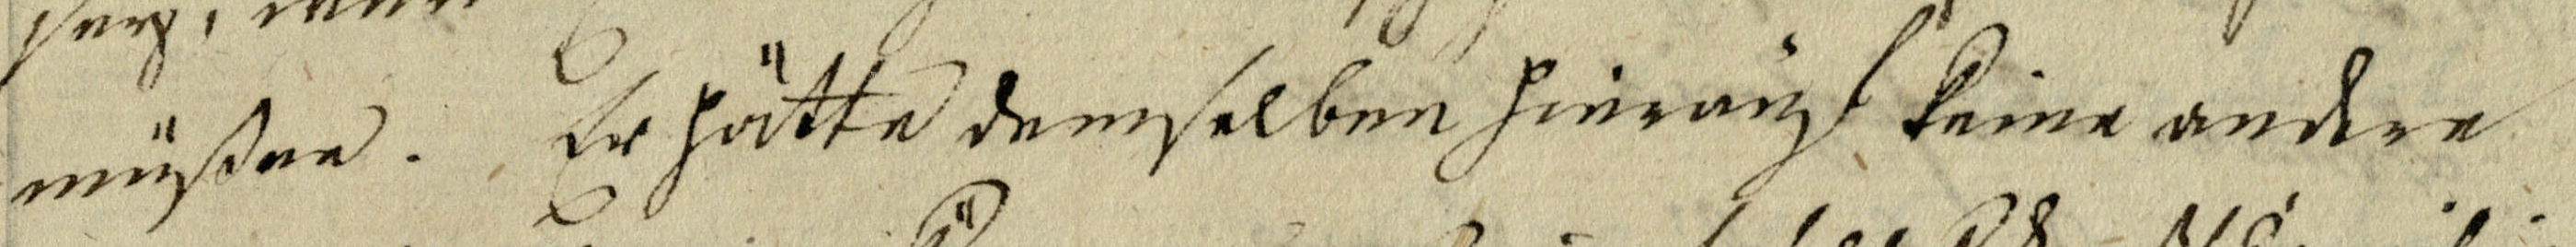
müßen. Er hätte demselben hierauf keine andere
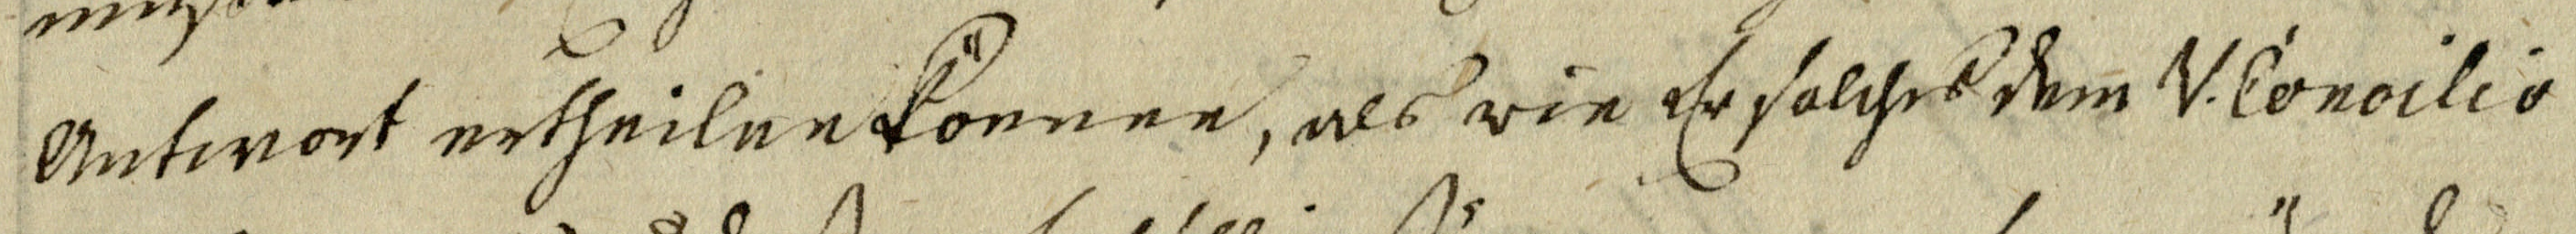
Antwort ertheilen können, als wie Er solches dem V. Concilio
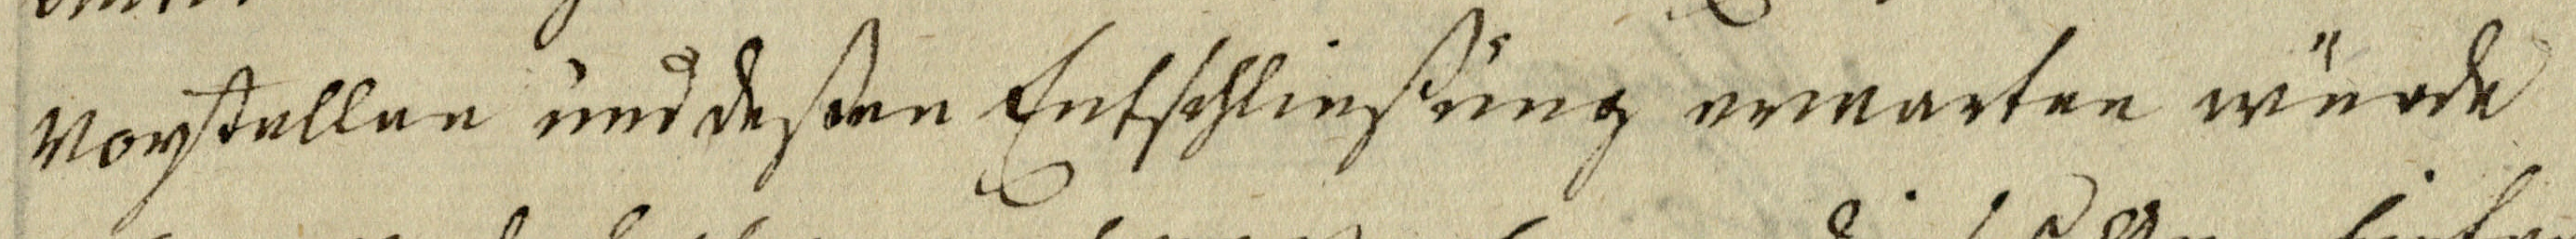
vorstellen und deßen Entschließung erwarten würde.
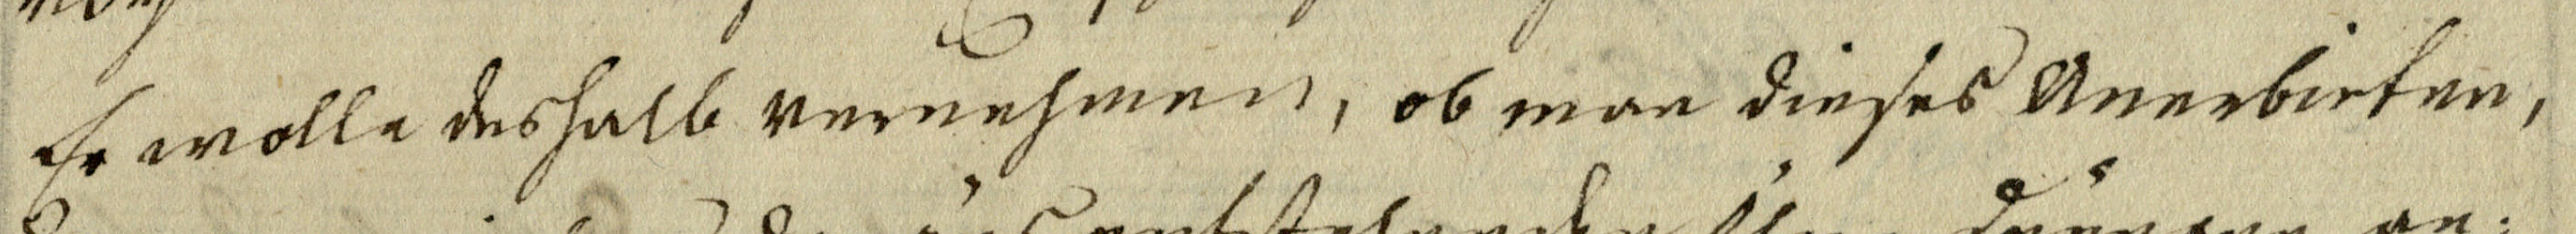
Er wolle deshalb vernehmen, ob man dieses Anerbieten,
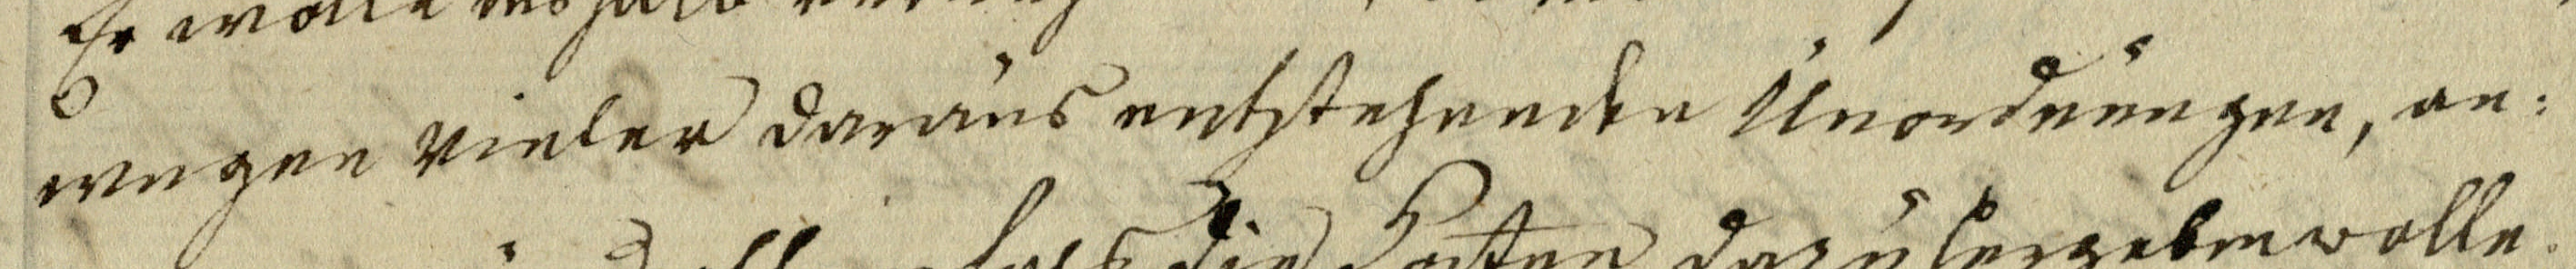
wegen vieler daraus entstehender Unordnungen, an¬
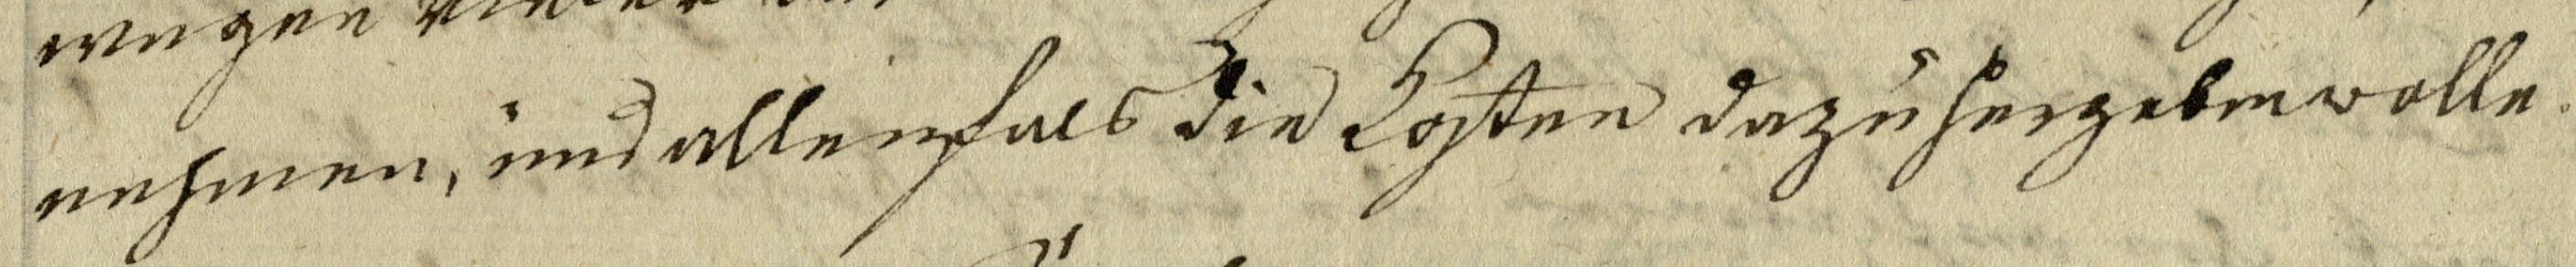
nehmen, und allenfals die Kosten dazu hergeben wolle.
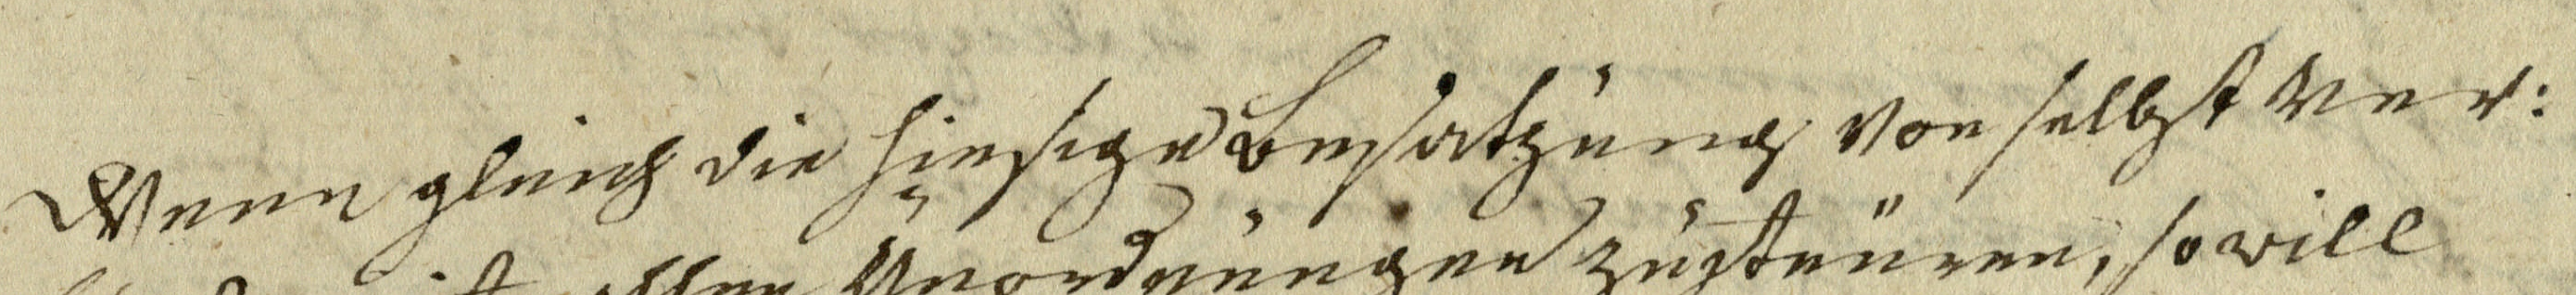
Wenn gleich die hiesige Besatzung von selbst ver¬
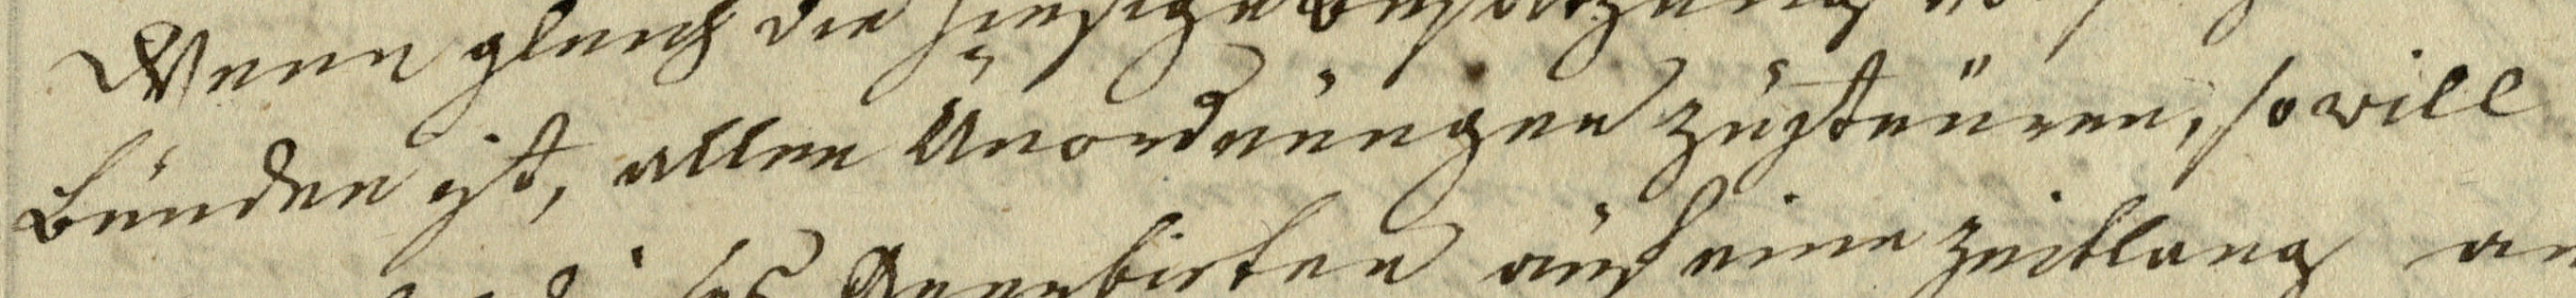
bunden ist, allen Unordnungen zusteuren, so will
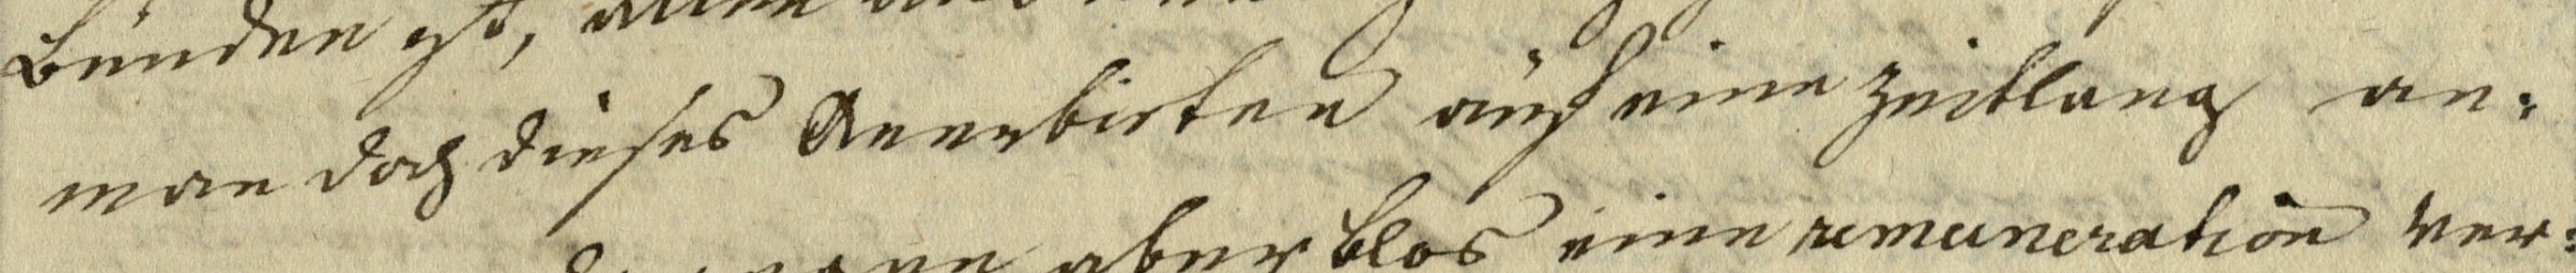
man doch dieses Anerbieten auf eine zeitlang an¬
